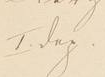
Januar
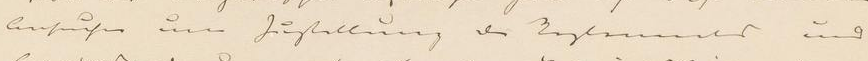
Ansuchen um Zustellung der Reglements und
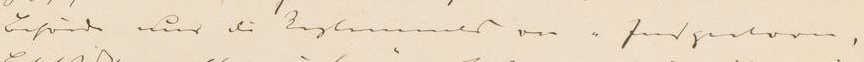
Behörde nur die Reglements an «Inspectoren,
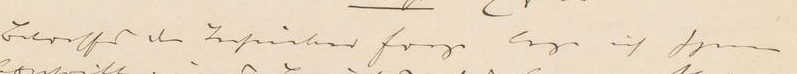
Betreffs der Techniker Frage lege ich Ihnen
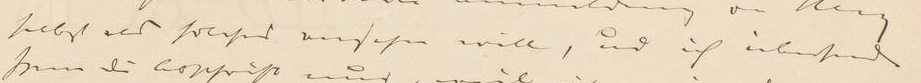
selbst als solches ansehen will, und ich übersende
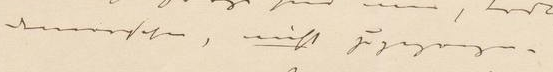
Demarschen, nicht zugegangen.
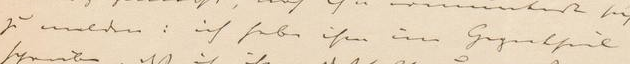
zu melden: ich habe ihm im Gegentheil
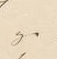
ge-
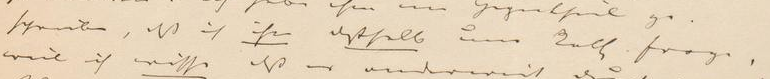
schrieben, daß ich ihndeßhalb um Rath frage,
